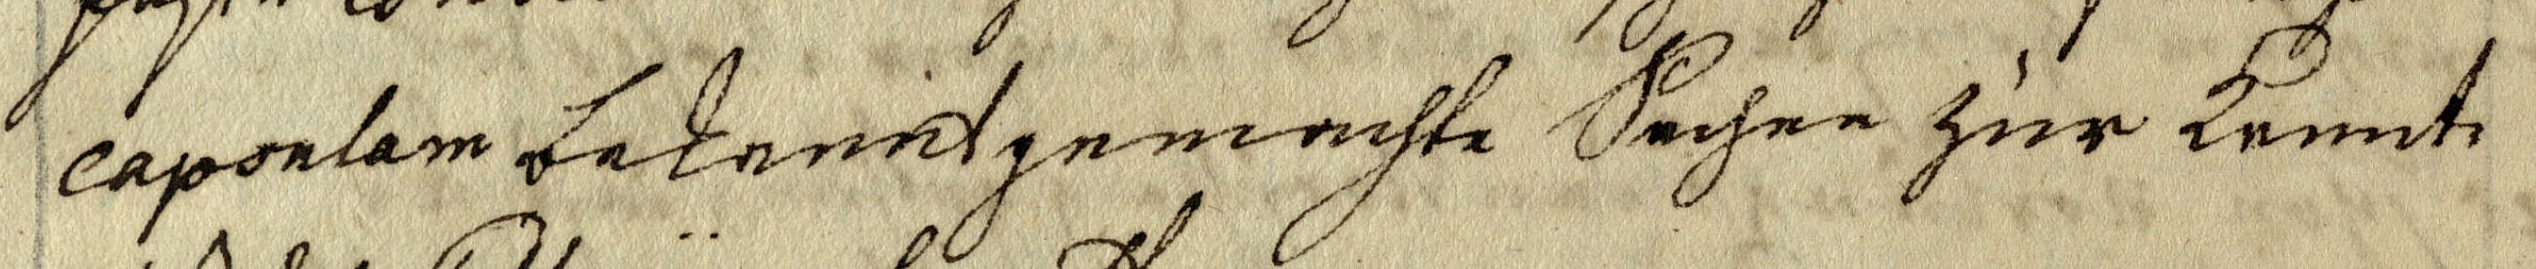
capsulam bekannt gemachte Sachen zur Kennt¬
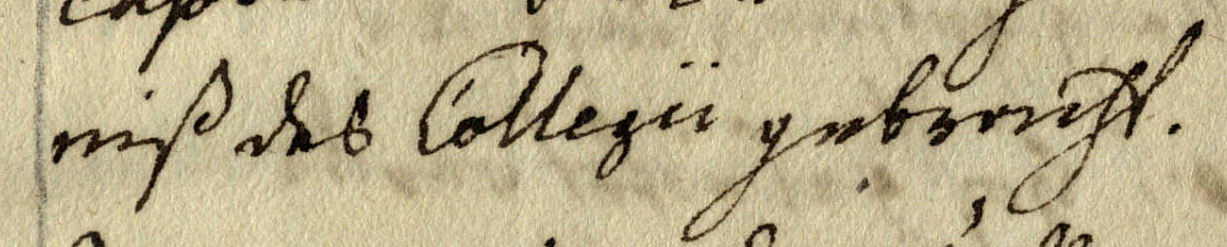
niß des Collegii gebracht.
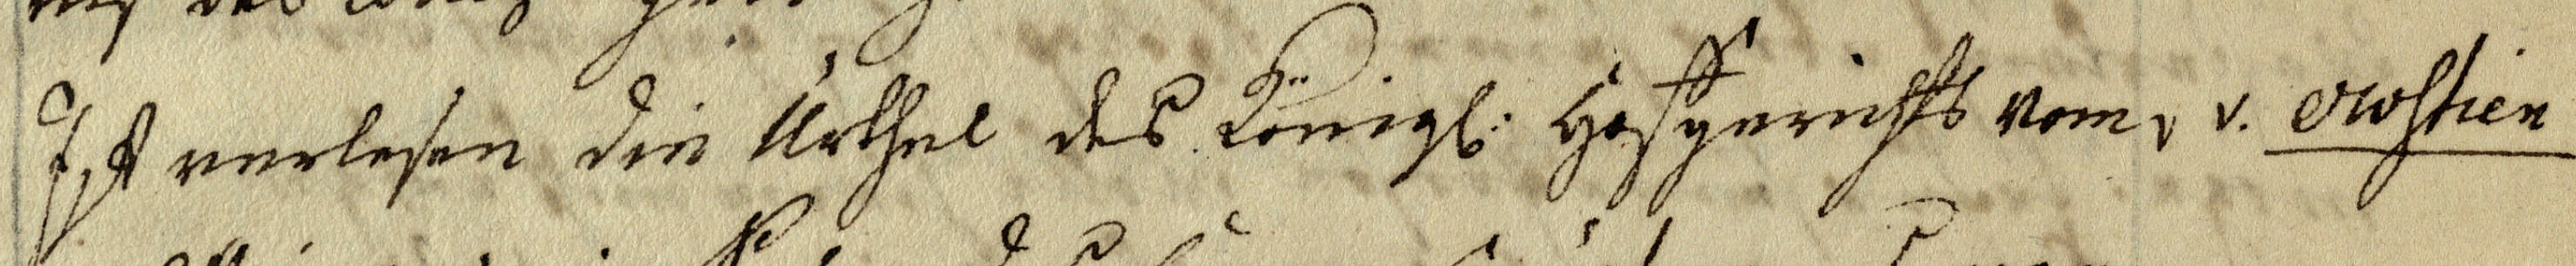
1. Ist verlesen die Urthel des Königl: Hofgerichts vom
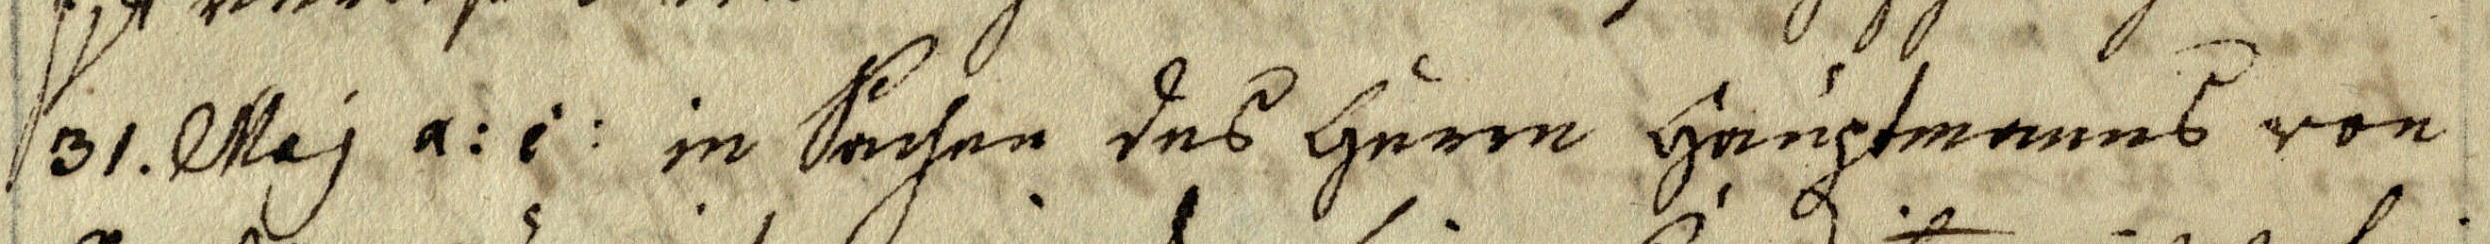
31. Maj a: c: in Sachen des Herrn Hauptmanns vom
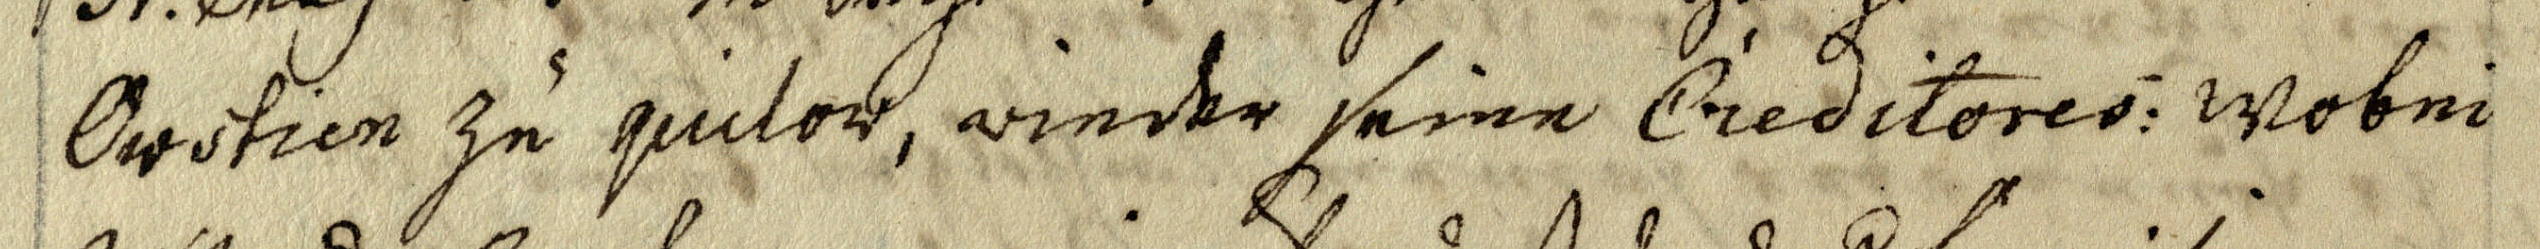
Owstien zu quilow, wieder seine Creditores: wobei
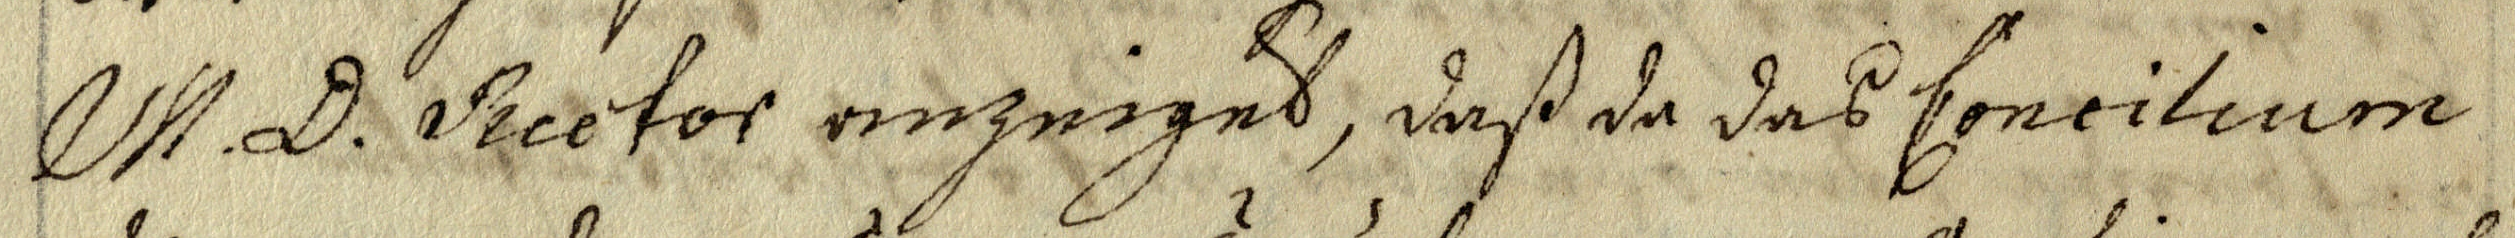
M. D. Rector anzeiget, daß da das Concilium
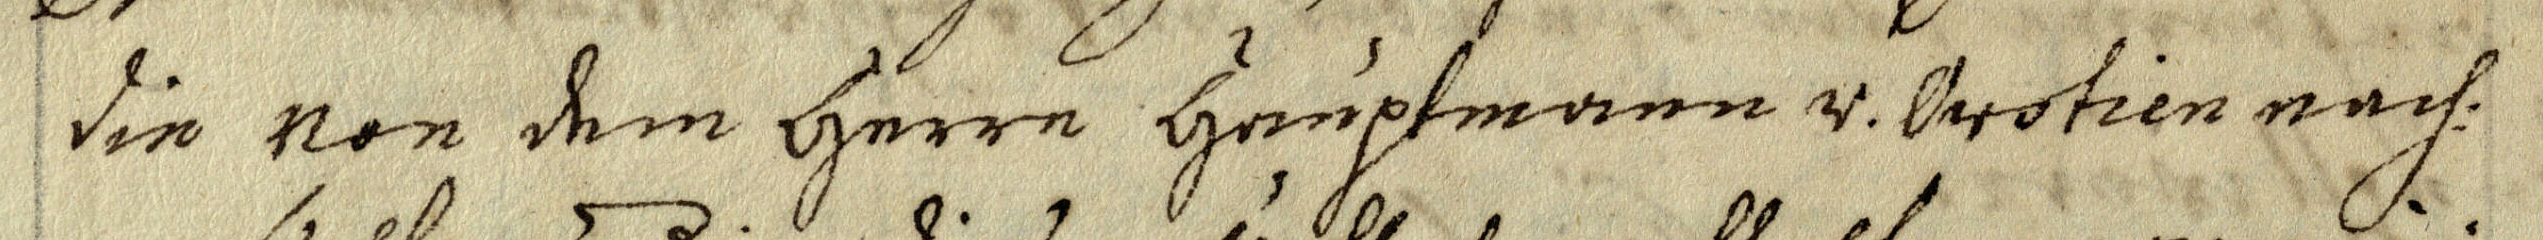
die von dem Herrn Hauptmann v. Owstien nach¬
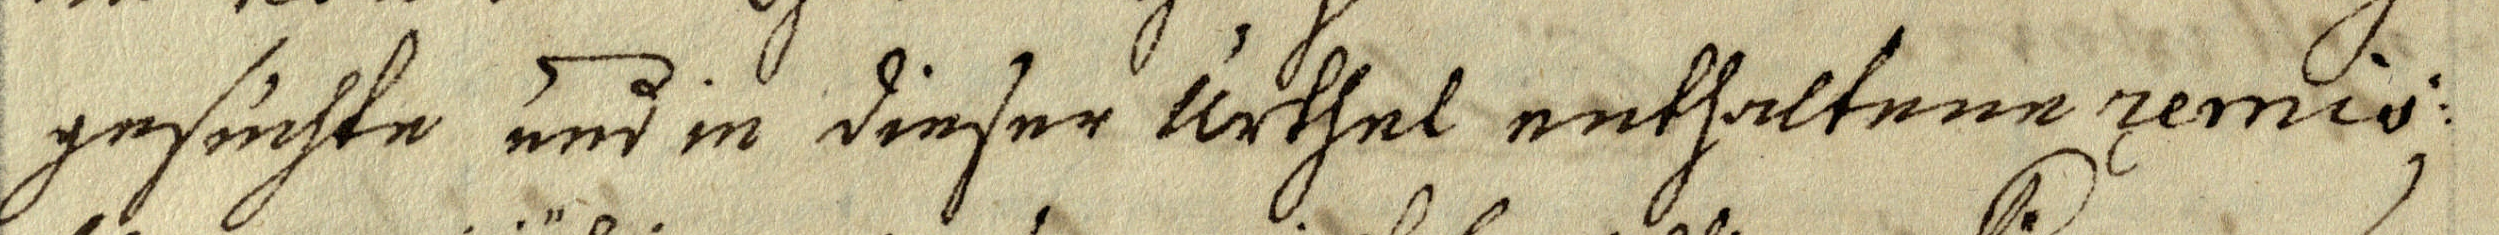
gesuchte und in dieser Urthel enthaltene remis¬
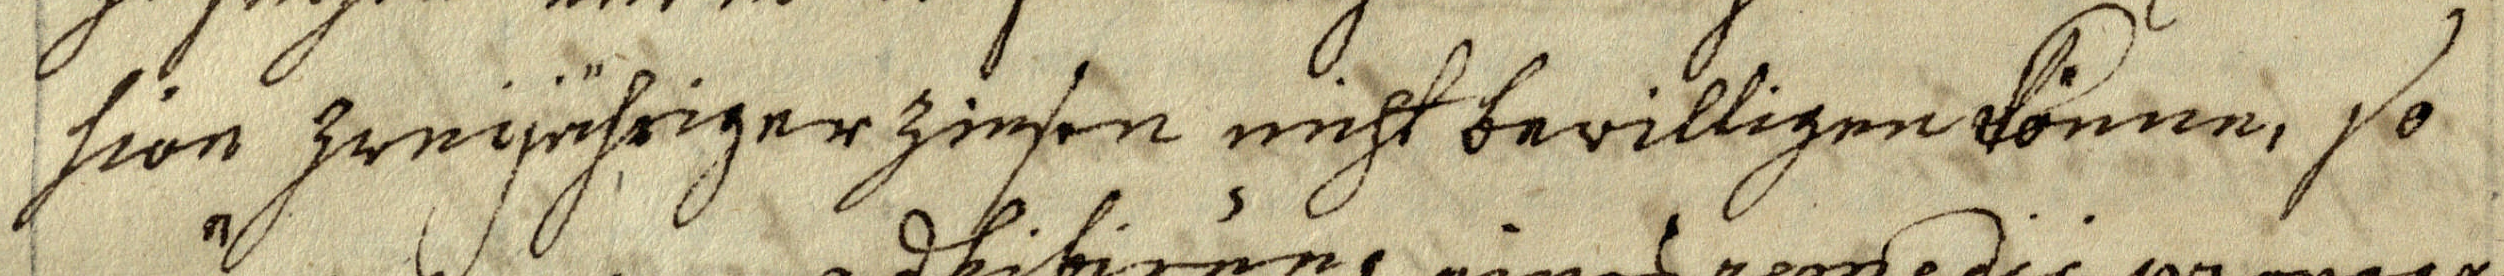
sion zweijähriger Zinsen nicht bewilligen könne, so
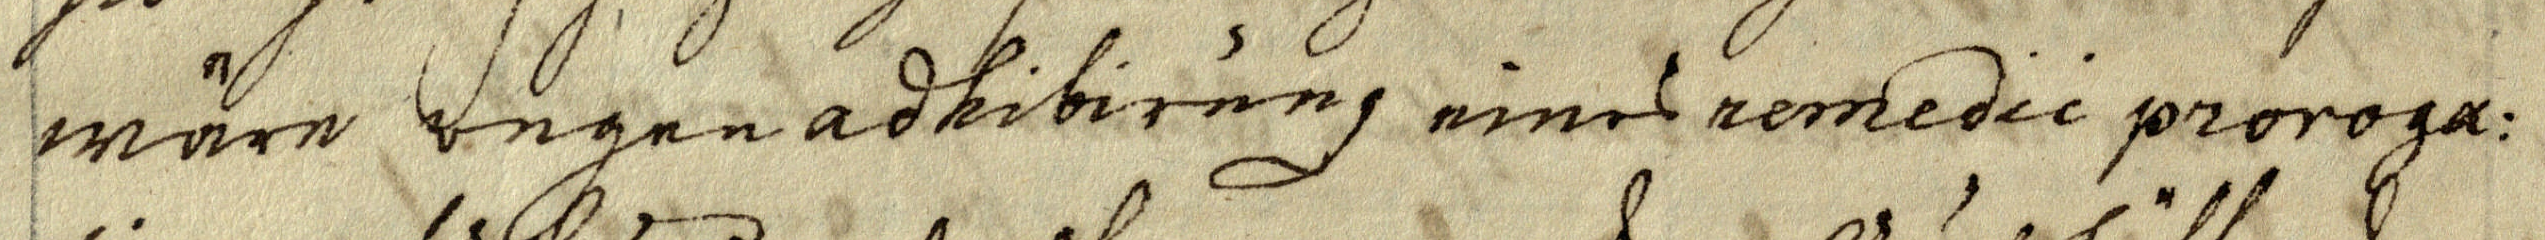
wäre wegen adhibirung eines remedii proroga¬
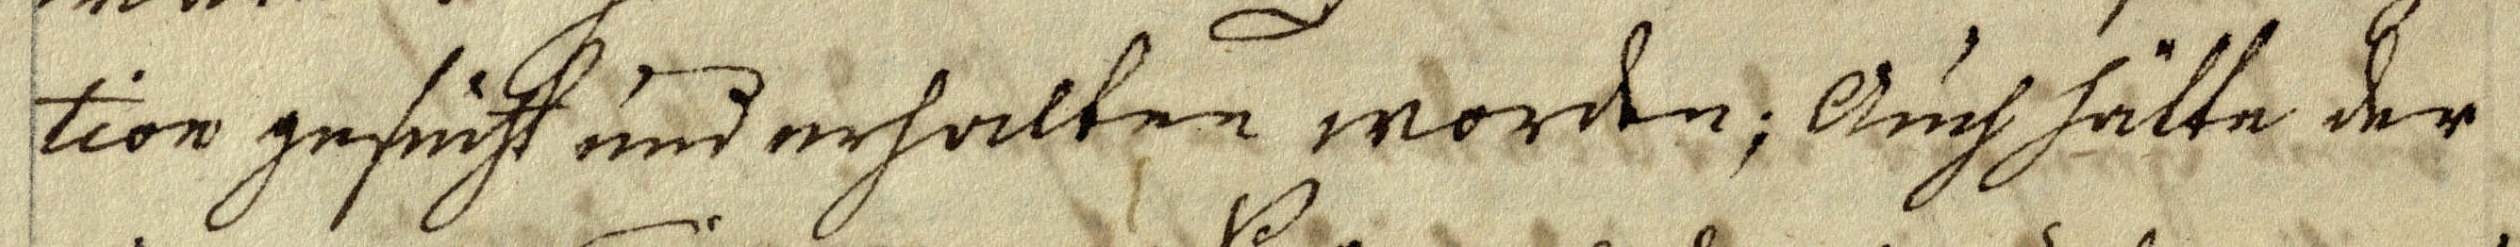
tion gesucht und erhalten worden; Auch hätte der
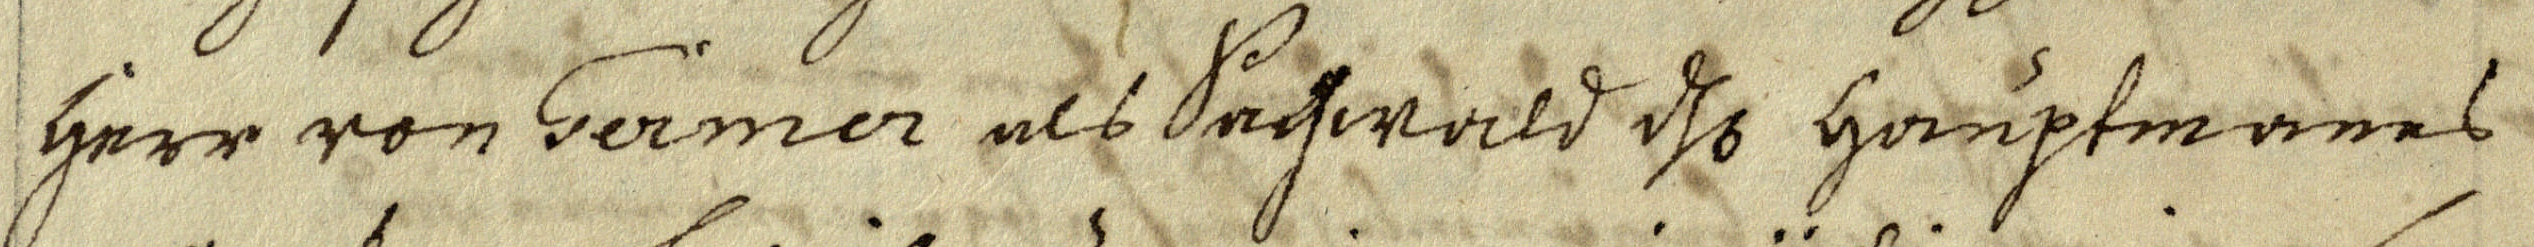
Herr von Germer als Sachwald dh Hauptmanns
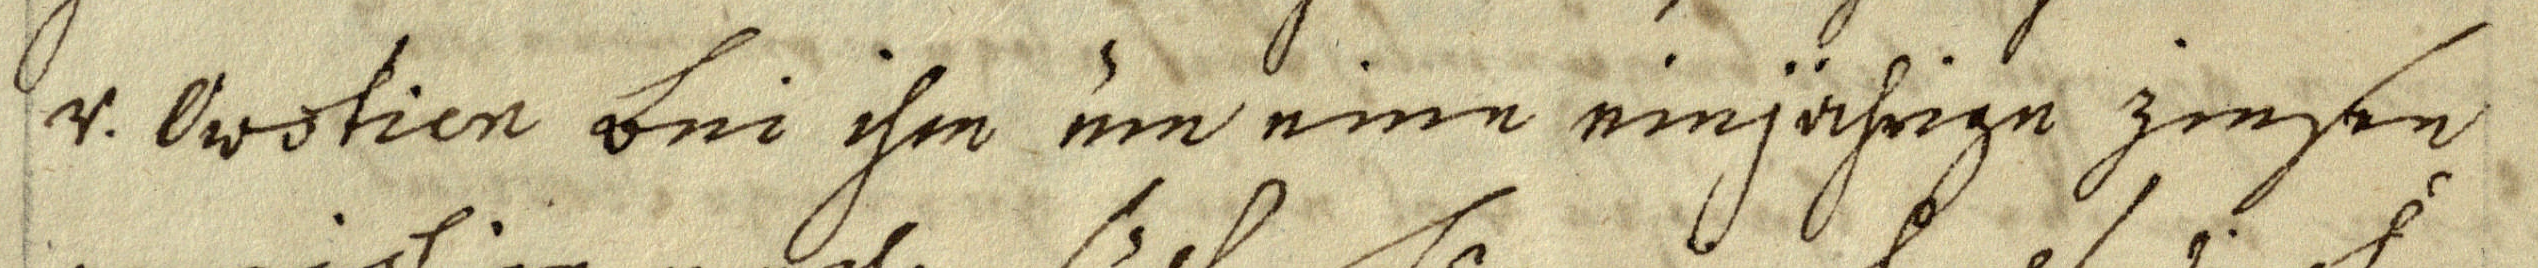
v. Owstien bei ihm um eine einjährige zinsen
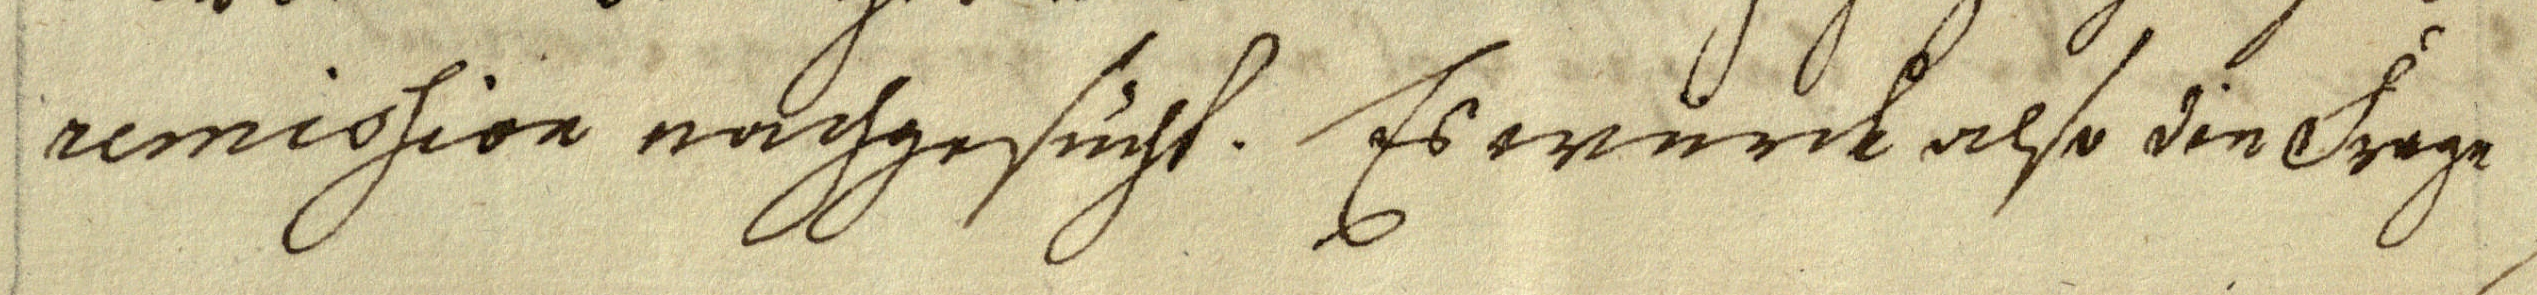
remission nachgesucht. Es würde also die Frage
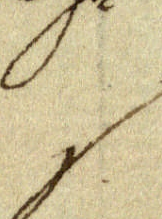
s
